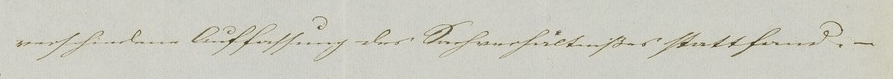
verschiedene Auffassung des Sachverhältnißes stattfand. –
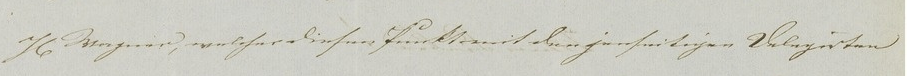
Herr Wagner, welcher diesen Punkt mit den jenseitigen Delegirten
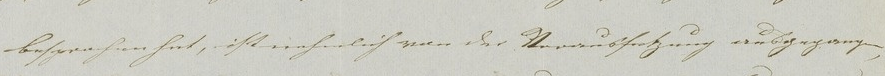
besprochen hat, ist nehmlich von der Voraussetzung ausgegangen,
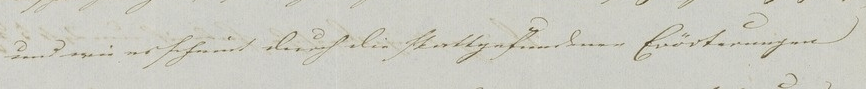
und wie es scheint durch die stattgefundenen Erörterungen
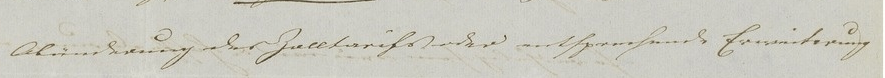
Abänderung des Zolltarifs oder entsprechende Erweiterung
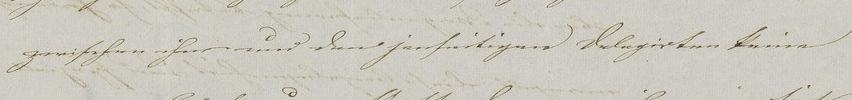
zwischen ihm und den jenseitigen Delegirten keine
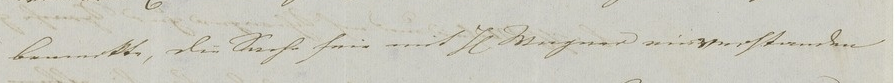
bemerkte, die Sache seie mit Herrn Wagner einverstanden
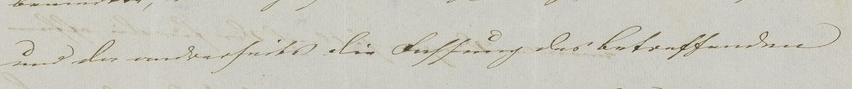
und da andrerseits die Fassung des betreffenden
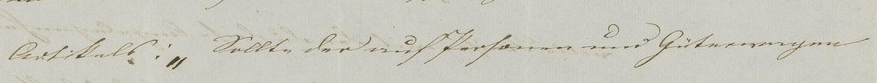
Artikels: «Sollte der auf Personen und Güterwagen
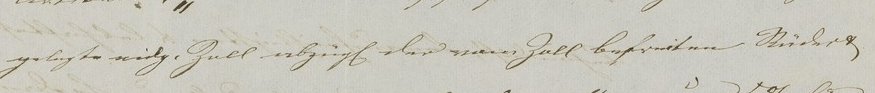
gelegte eidg. Zoll abzüglich der vom Zoll befreiten Räder &
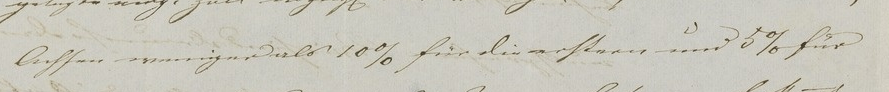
Achsen weniger als 10% für die erstern und 5% für
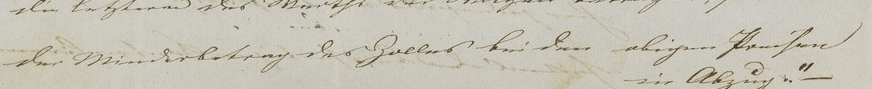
der Minderbetrag des Zolles bei den obigen Preisen
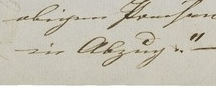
in Abzug.» –
